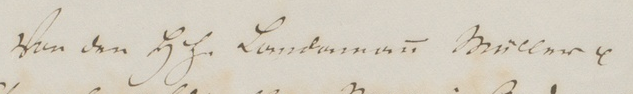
Von den HH. Landamann Müller &
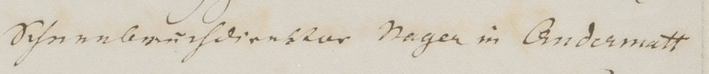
Schneebruchdirektor Nager in Andermatt
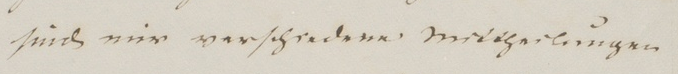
sind mir verschiedene Mittheilungen
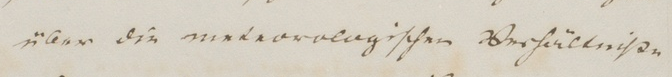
über die meteorologischen Verhältniße
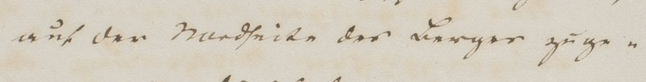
auf der Nordseite des Berges zuge-
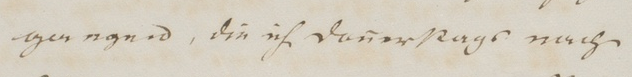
gangen, die ich donnerstags nach
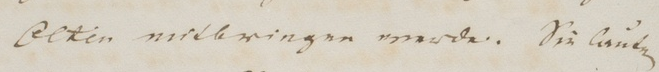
Olten mitbringen werde. Sie lauten
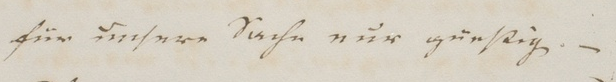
für unsere Sache nur günstig. -
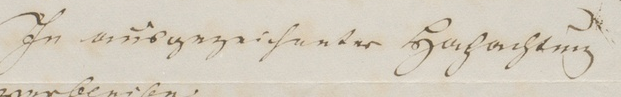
In ausgezeichneter Hochachtung
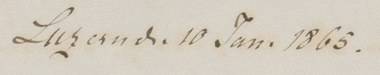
Luzern d. 10 Jan. 1865.
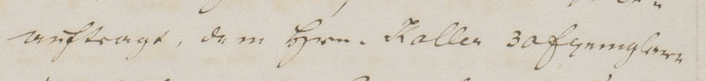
auftragt, dem Hrn. Koller 30 Exemplare
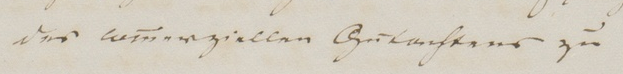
des commerziellen Gutachtens zu
